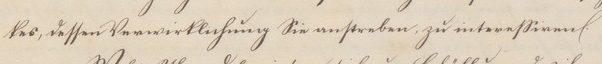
kes, dessen Verwirklichung Sie anstreben, zu interessiren.
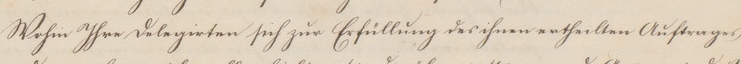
Wohin Ihre Delegirten sich zur Erfüllung des ihnen ertheilten Auftrages
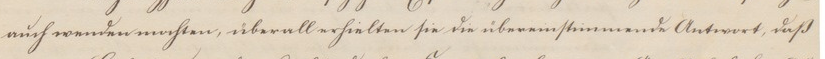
auch wenden mochten, überall erhielten sie die übereinstimmende Antwort, daß
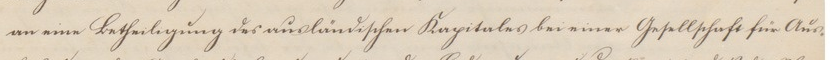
an eine Betheiligung des ausländischen Kapitales bei einer Gesellschaft für Aus-
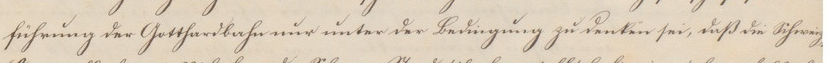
führung der Gotthardbahn nur unter der Bedingung zu denken sei, daß die Schweiz.
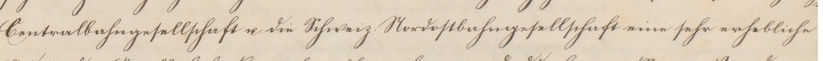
Centralbahngesellschaft & die Schweiz. Nordostbahngesellschaft eine sehr erhebliche
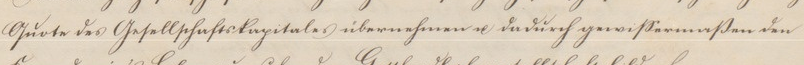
Quote des Gesellschaftskapitales übernehmen & dadurch gewissermaßen den
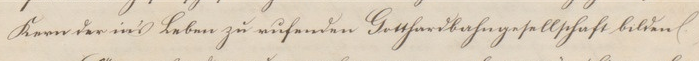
Kern der in's Leben zu rufenden Gotthardbahngesellschaft bilden.
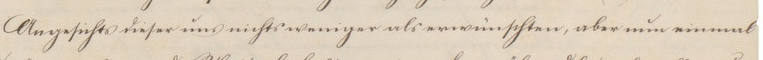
Angesichts dieser uns nichts weniger als erwünschten, aber nun einmal
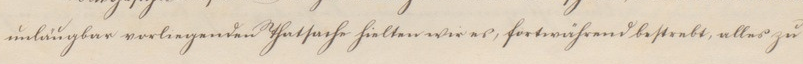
unläugbar vorliegenden Thatsache hielten wir es, fortwährend bestrebt, alles zu
